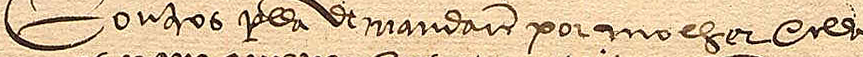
E outros pel̄la demandare̅ por molher e ella
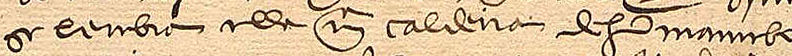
se lembra ella ma caldeira de hu̅ mançebo
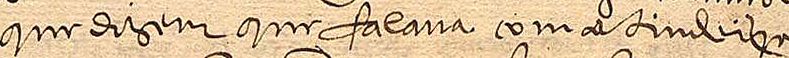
que dizem que falaua com a tindeira
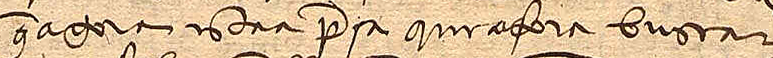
q̅ agora estaa p̄sa que a fora buscar
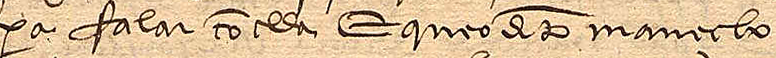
ꝑa falar co̅ ella E que o d̅ito mançebo
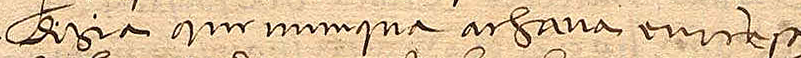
dizia que numqua achaua em casa
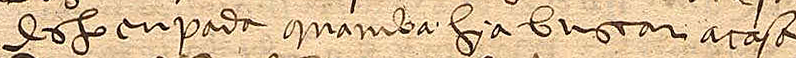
deshocupada quando hya buscar a casa
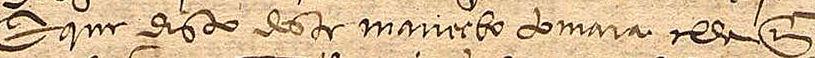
E que disto deste mançebo tomara ella m̄a
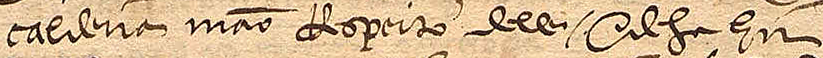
caldeira ma̅o Respeito delle / e de ha hir
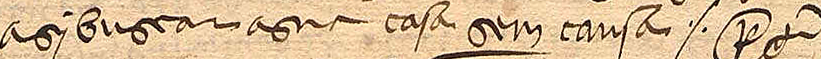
asy buscar a sua casa sem causa ./. p̄gu̅
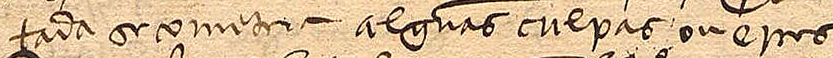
tada se cometera algu̅as culpas ou erros
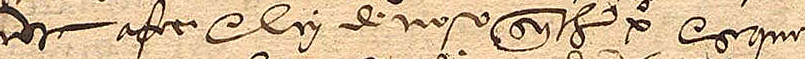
c̅tra a fee e ley de noso s̅r Ihu xo e se que
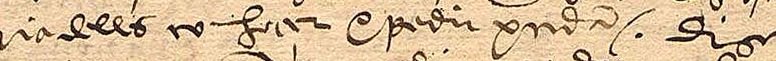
ria delles conheçer e pedir perda̅ /. dise
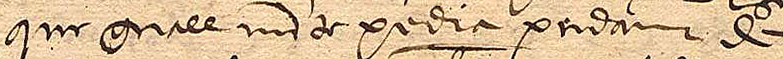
que gerallme̅te pedia perdam de
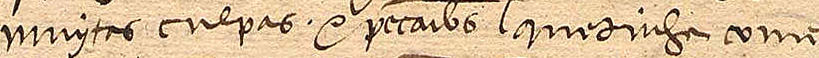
muytas culpas. e pecados que tinha come
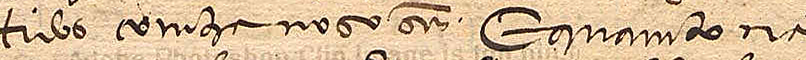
tidos comtra noso s̅or. E quamto era
